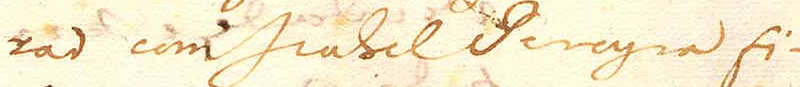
zar com Jzabel Pereyra fi
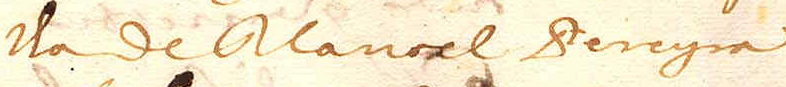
lha de Manoel Pereyra
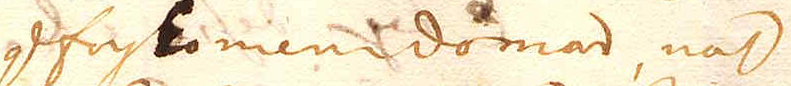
q̄ foy homem do mar, naõ
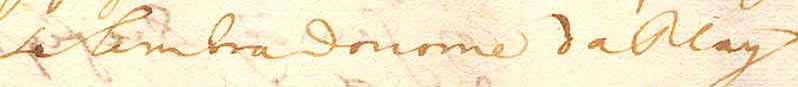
se lembra do nome da May
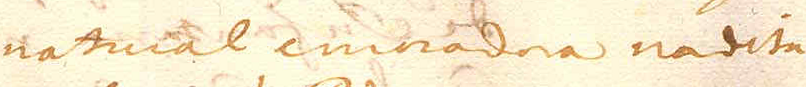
natural, e moradora na dita
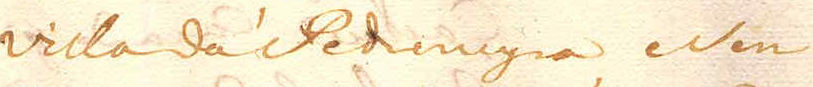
villa da Pedreneyra, e sen
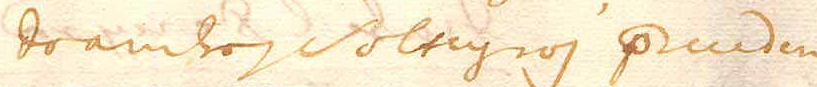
do ambos solteyros pReceden
